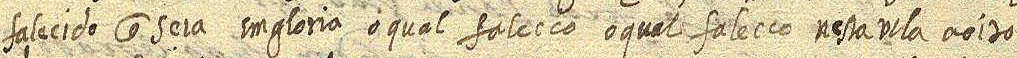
falecido q̄ seia Em gloria o qual faleceo o qual faleceo nesta vila a oito
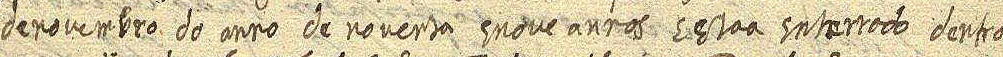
de nouembro do anno de nouenta E noue annos E estaa Enterrado dentro
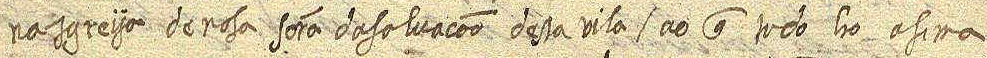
na Jgreija de nosa sorā da saluacão desta vila / ao q̄ tudo ho asima
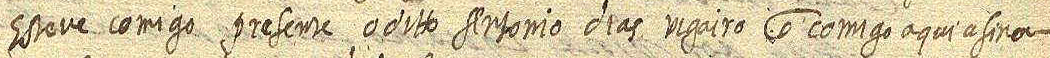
Esteue comigo presente o ditto Antonio dias vigairo q̄ comigo aqui asinou
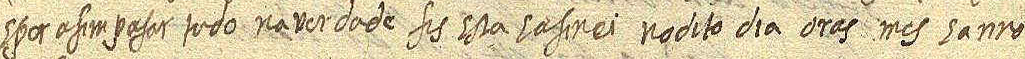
E por asim pasar tudo na verdade fis Esta E asinei no dito dia oras mes E anno
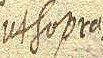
ut supra:
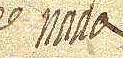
pḡ nada
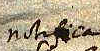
notefica
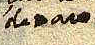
de maio.
